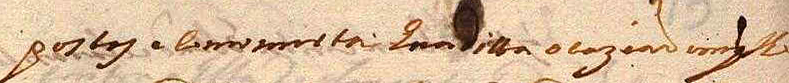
postas e como morta E na ditta ocaziaõ em q̄ lhe
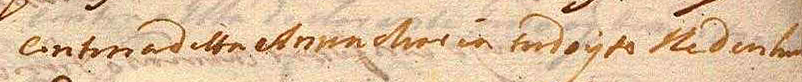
contou a ditta Anna Maria tudo jsto lhe deu hum
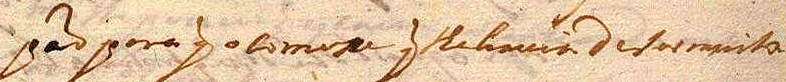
paõ pera q̄ o comesse q̄ lhe havia de ser muito
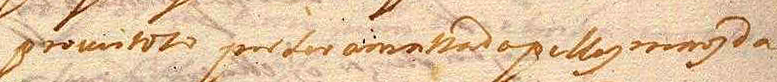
proveitozo por ser amassado pellas maos da
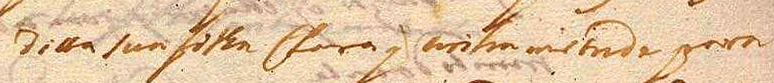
ditta sua filha Clara q̄ tinha virtude para
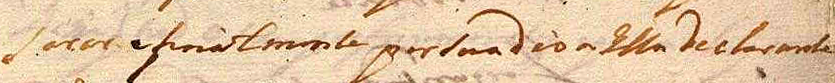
sarar e finalmente persuadio a Ella declarante
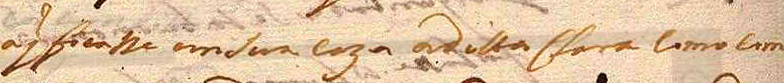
a q̄ ficasse em sua caza a ditta Clara como com
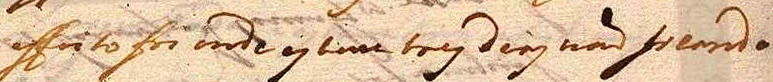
effeito foi onde esteue tres dias naõ ficando
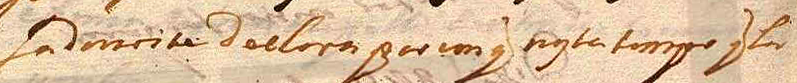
la de noite declara porem q̄ neste tempo q̄ la
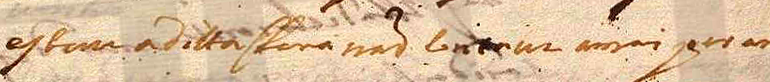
esteue a ditta Clara naõ contaua a mai peran
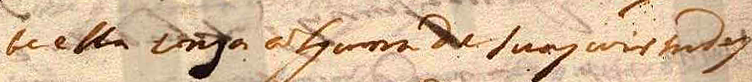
te ella couza alguma de suas uirtudes
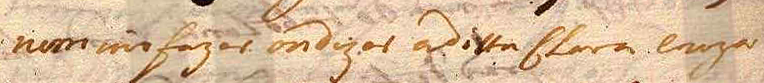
nem uio fazer ou dizer a ditta Clara couza
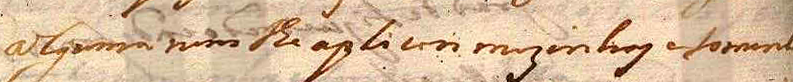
alguma nem lhe aplicou mezinhas e somente
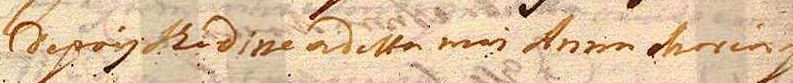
depois lhe disse a ditta mai Anna Maria q̄
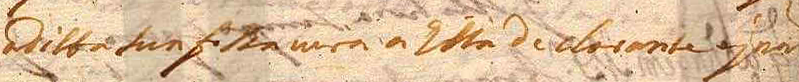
a ditta sua filha vira a Ella declatante q̄ naõ
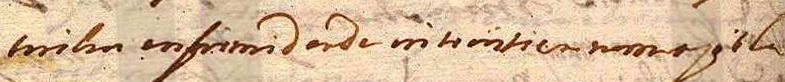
tinha enfermidade intrentica nem apola
